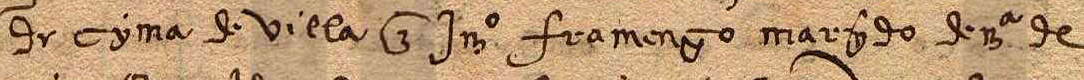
de cyma de villa item Jmo framengo marydo de ma de
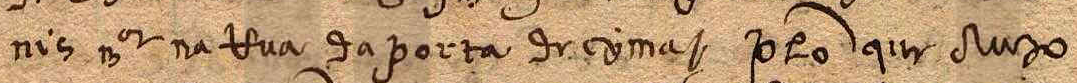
nis mor na Rua da porta de cyma / Pl̄o que Auto
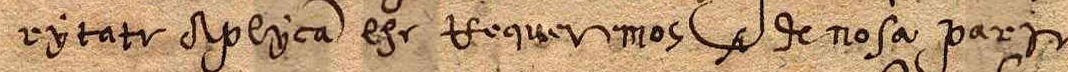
rytate Aplycā lhe Requeremos e de nosa parte
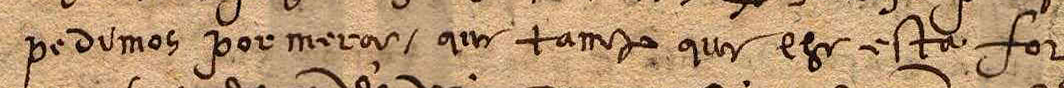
pedimos por merce / que tamto que lhe esta for
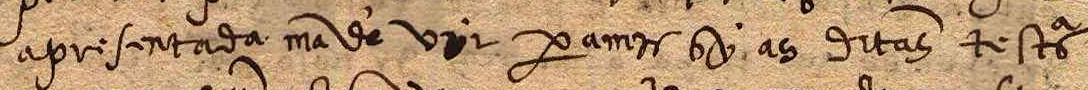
apresentada māde vyr ꝑamte sy as ditās testas
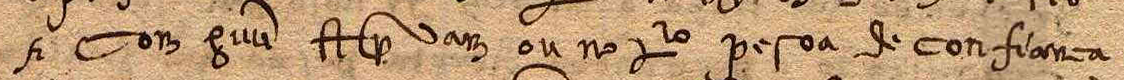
e Com huū stp̄vam ou notro pesoa de confiança
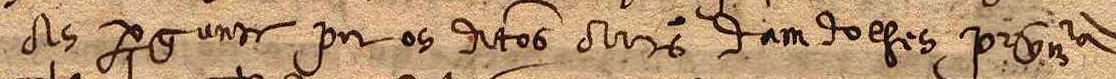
As ꝑgunte por os ditōs Artos damdolhes prȳmra
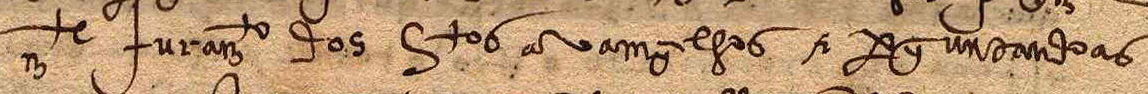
mte Juramto dos Stos avamgelhos e ꝑḡuntandoas
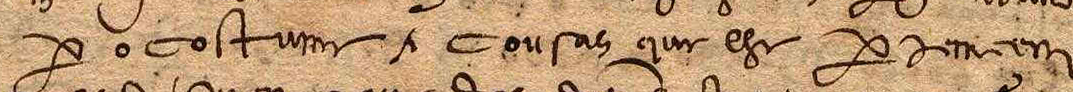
ꝑo costume e cousas que lhe ꝑtemcem
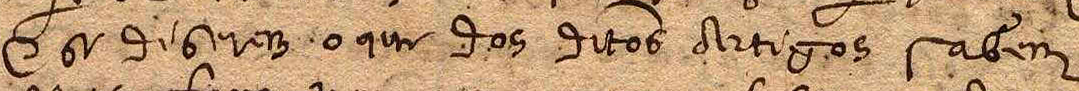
e se diserem o que dos ditōs Artigos sabem
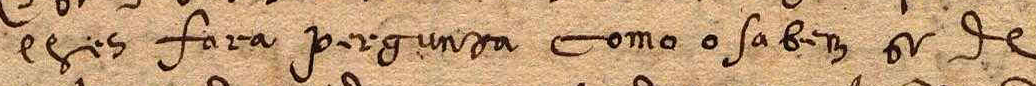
lhes fara pergunta como o sabem se de
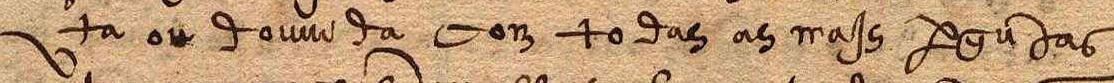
Vta ou douuida com todas as maJs ꝑgūtas
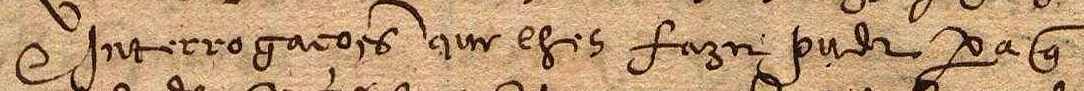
e Jnterrogaçoẽs que lhes fazer puder ꝑa q̄
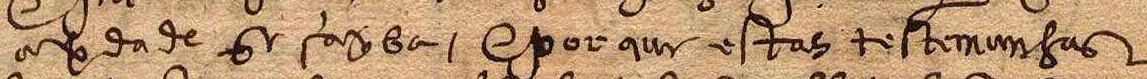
a ꝟdade se sayba / e porque estas testemunhas
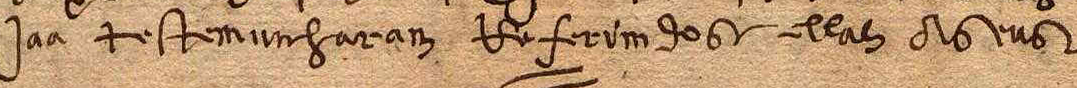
Jaa testemunharam Referimdose ellas A seus
